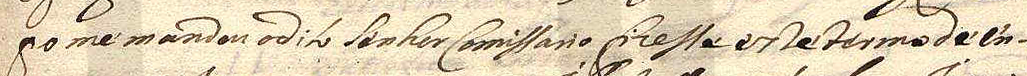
po me mandou o dito Senhor Comissario fizesse este termo de en
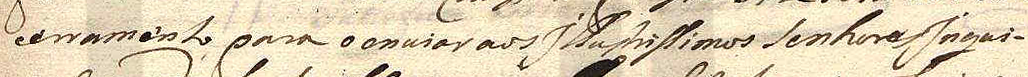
cerramento para o enuiar aos Jllustrissimos Senhores Jnqui
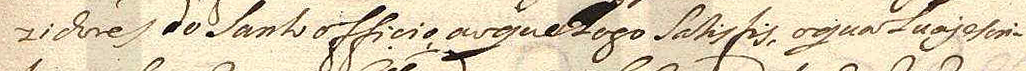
zidores do santo officio ao que Logo satisfis, o qual uaj escri
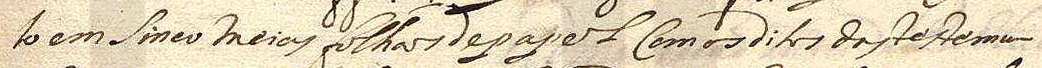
to em sinco meias folhas de papel Com os ditos das testemun
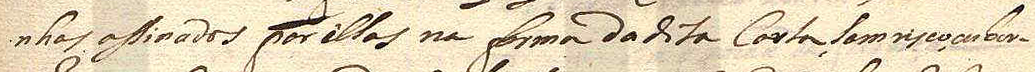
nhas assinados por ellas na forma da dita Carta, sem risco, ou bor
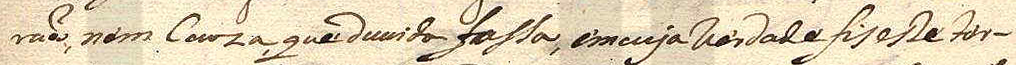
raõ, nem Couza, que duuida fassa, em cuja verdade fis este ter
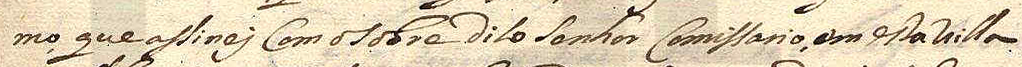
mo, que assinej Com o sobredito senhor Comissario, em esta Villa
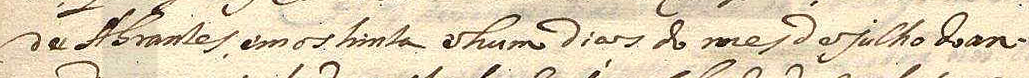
de Abrantes, em os trinta e hum dias do mes de julho do an
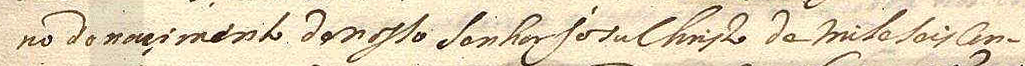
no do nacimento de nosso Senhor Jesu Christo de mil e seiscen
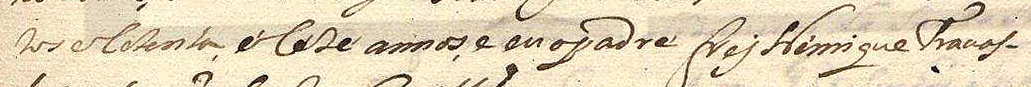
tos e cetenta, e cete annos, e eu o padre frej Henrique Trauas
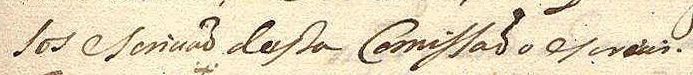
sos escriuaõ desta Comissaõ o escreui.
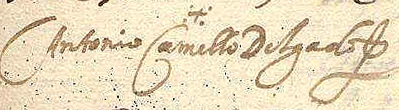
Antonio Camello Delgado
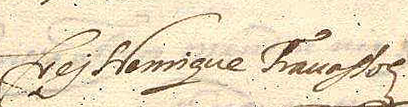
frej Henrique Trauassos
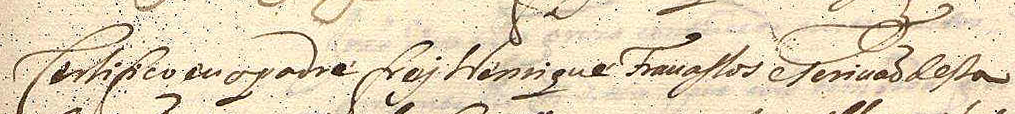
Certifico eu o padre frej Henrique Trauassos escriuaõ desta
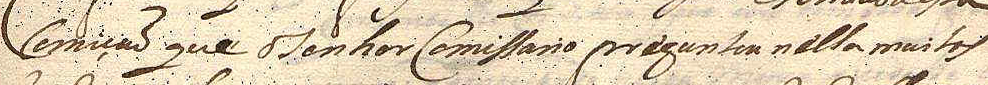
Comiçaõ que o Senhor Comissario preguntou nella muitas
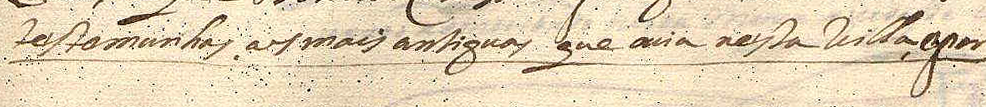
testemunhas, as mais antiguas que auia nesta Villa, e por
